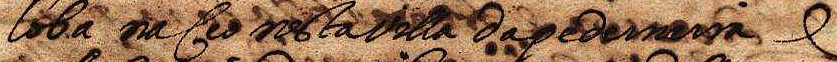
loba naCeo nesta villa da pederneira e
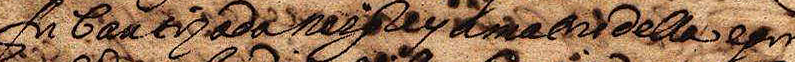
foi bautizada na igreija matris della e por
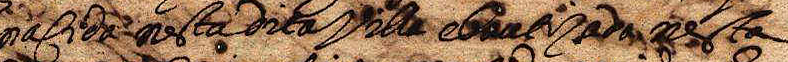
naCida neste dita Villa e bautizada nesta
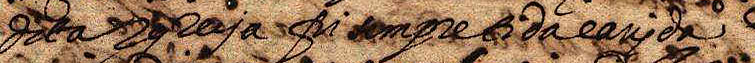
dita igreija fui sempre tida e auida E
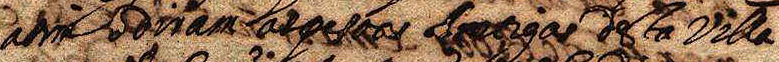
asim o diram as pesoas Amtigas desta Villa
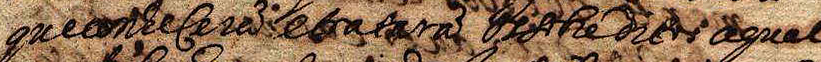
que conheCeraõ e trataraõ os sobreditos a qual
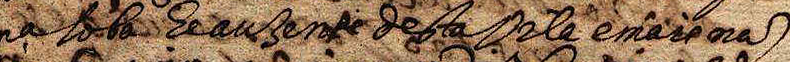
ma loba he auzente desta Vila e mais naõ
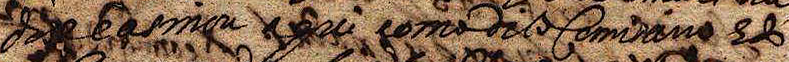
dise e asinou aqui com o dito Comisario E do
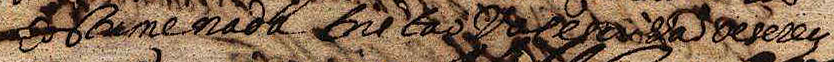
Costume nada tristao Vaz escrivaõ o escreuj
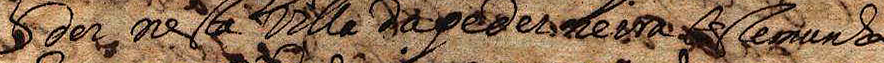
dor nesta Villa da pederneira testemunha
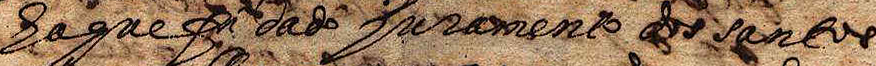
E a que foi dado Juramento dos santos
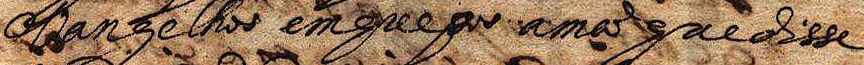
eVangelhos em que pos a maõ que disse
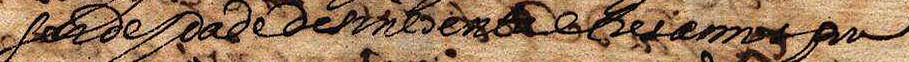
ser de jdade de sincoenta e tres annos pou
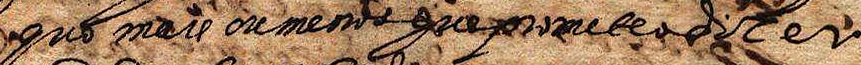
quo mais ou menos que prometeo dizer
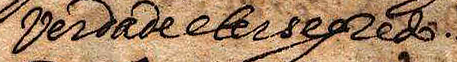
Verdade e ter segredo.
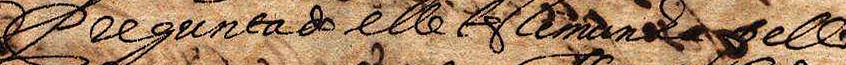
Preguntado elle testemunha pello
